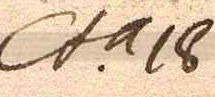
Ct.a 18
